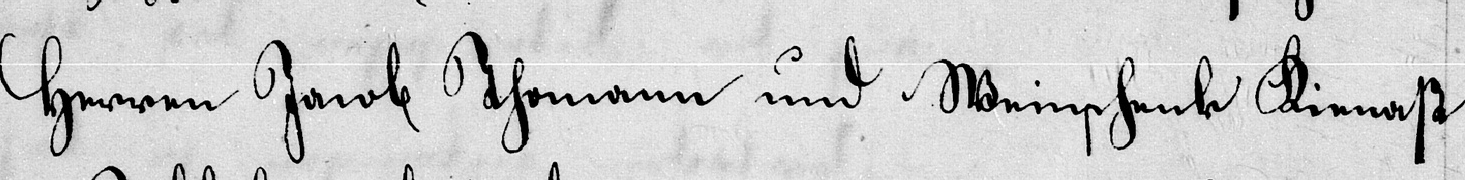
Herren Jacob Thomann und Weinschenk Kienast
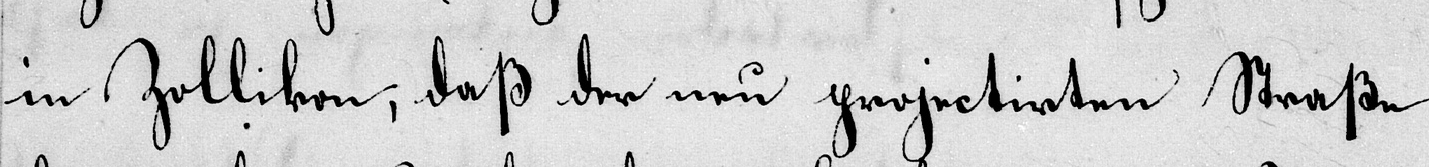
in Zollikon, daß der neu projectirten Straße
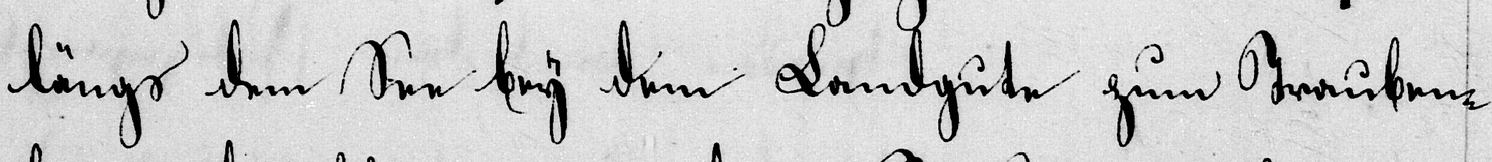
längs dem See bey dem Landgute zum Trauben¬
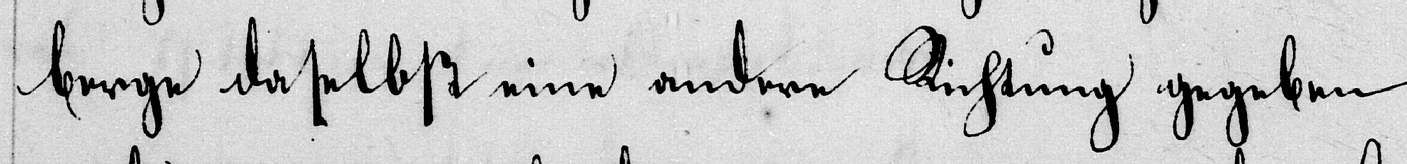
berge daselbst eine andere Richtung gegeben
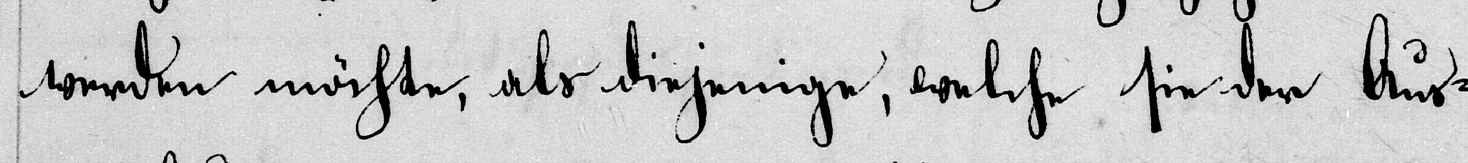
werden möchte, als diejenige, welche sie der Aus¬
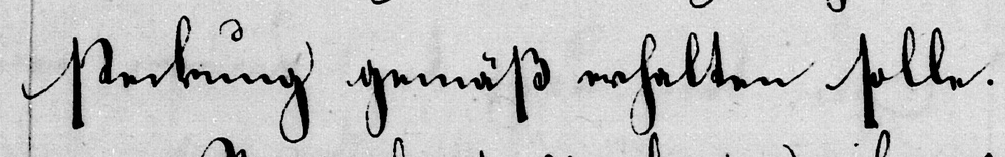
steckung gemäß erhalten solle.
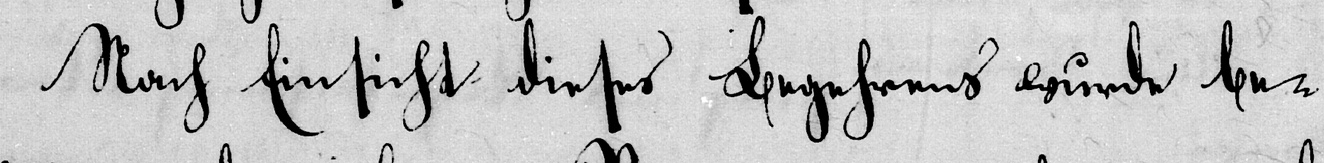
Nach Einsicht dieses Begehrens wurde be¬
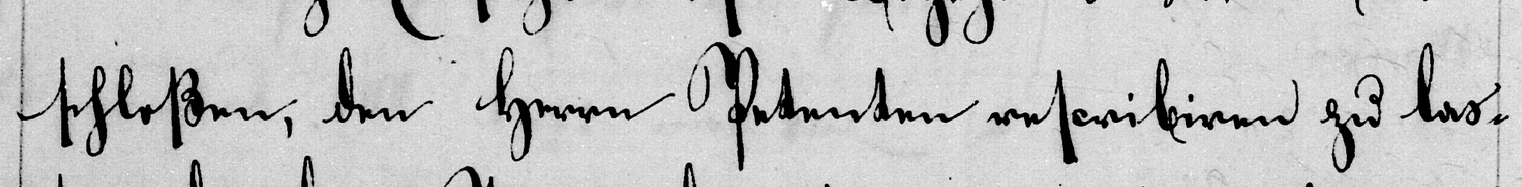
schloßen, den Herrn Petenten rescribiren zu laß¬
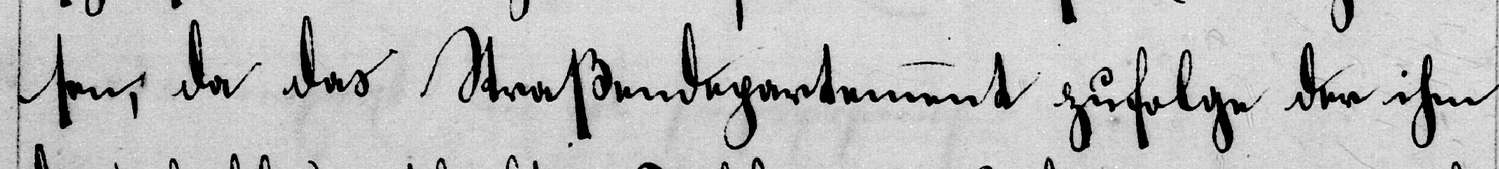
en, da das Straßendepartement zufolge der ihr
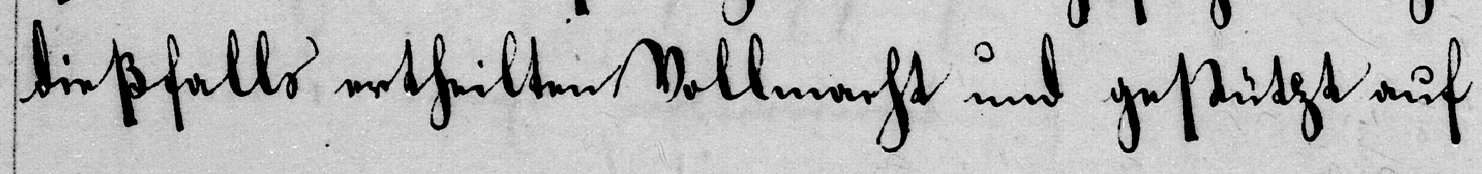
dießfalls ertheilten Vollmacht und gestützt auf
